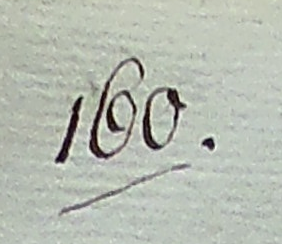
160.
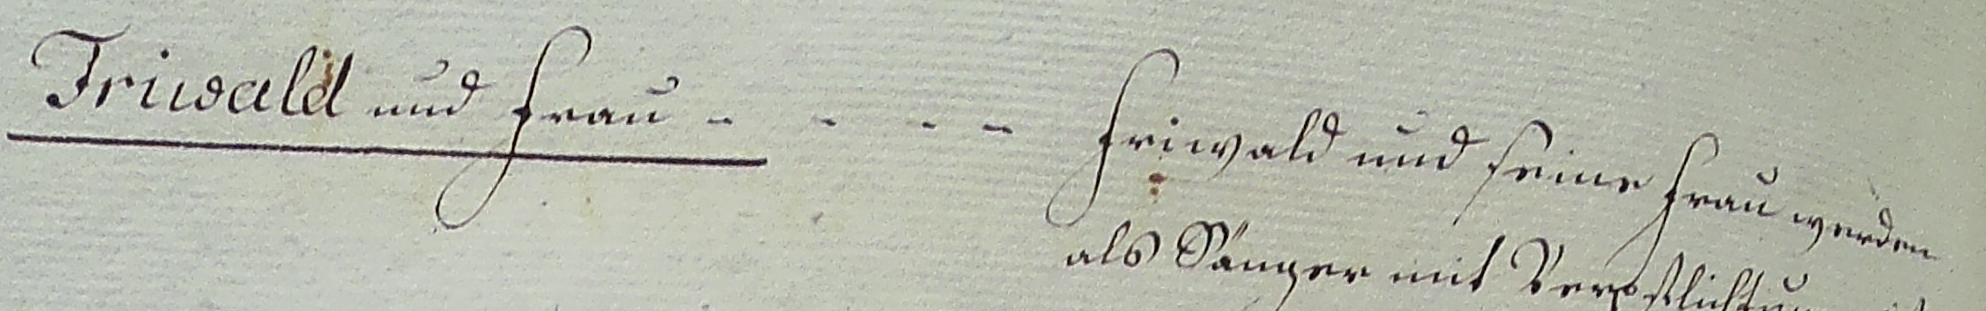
Friwald und Frau .. .. .. .. Friwald und seine Frau werden
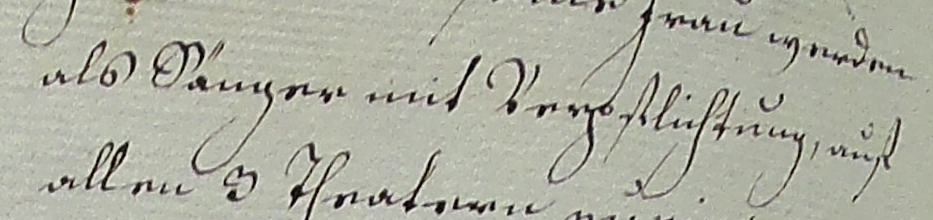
als Sänger mit Verpflichtung, auf
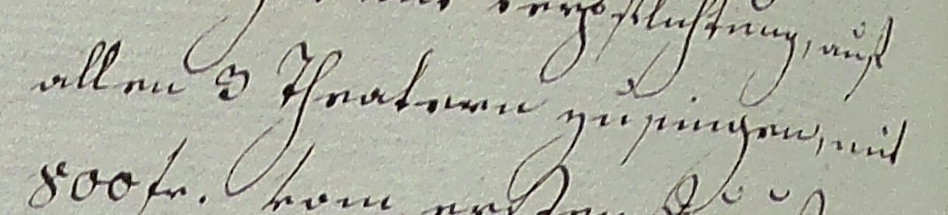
allen 3 Theatern zusingen, mit
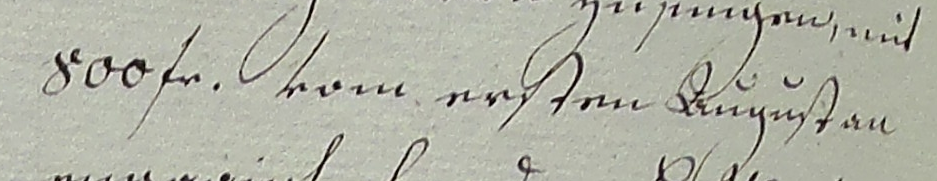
800fr. vom ersten August an
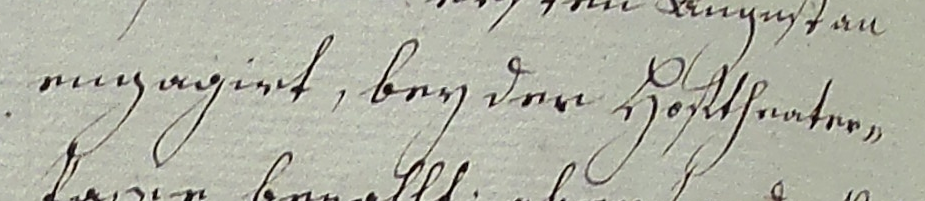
engagirt, bey der Hoftheater¬
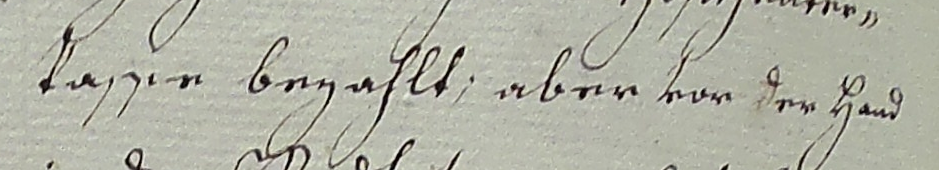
kasse bezahlt, aber vor der Hand
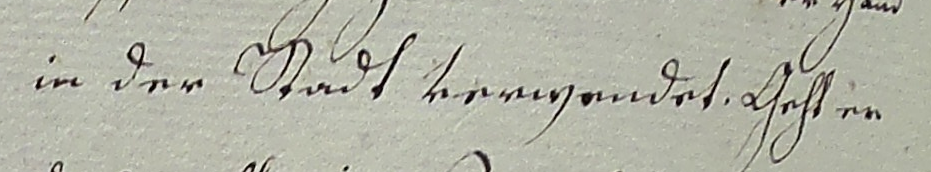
in der Stadt verwendet. Geht er
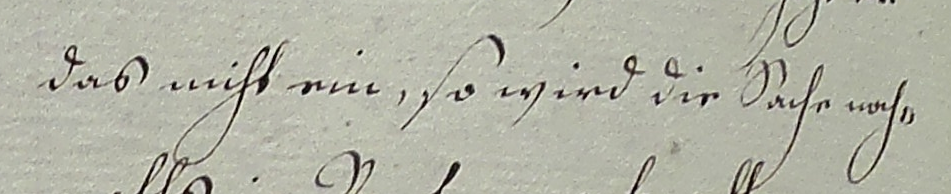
das nicht ein, so wird die Sache noch¬
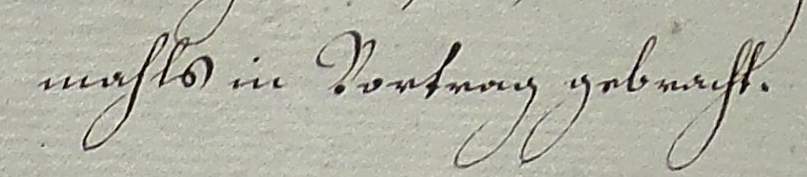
mahls in Vortrag gebracht.
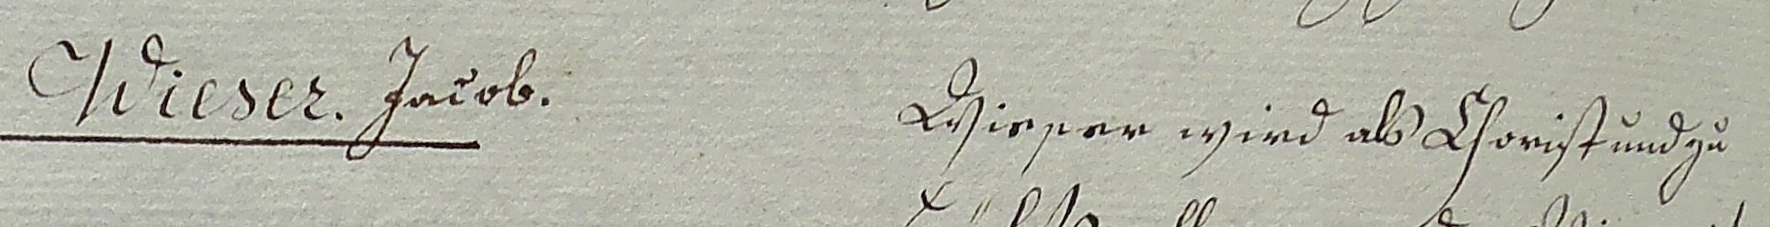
Wieser. Jacob. Wieser wird als Chorist und zu
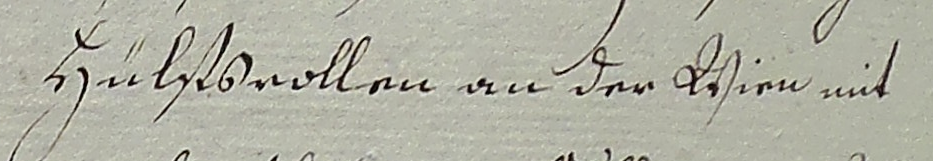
Hülfsrollen an der Wien mit
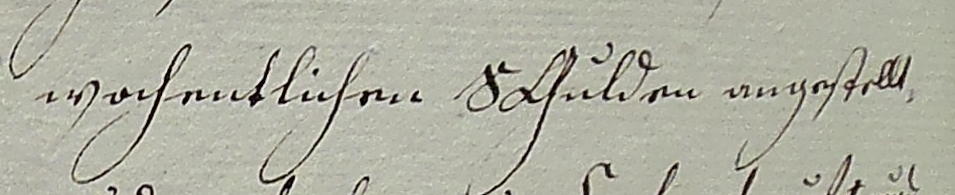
wochentlichen 8 Gulden angestellt,
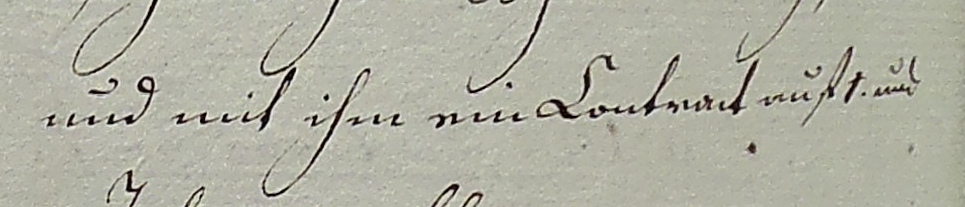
und mit ihm ein Contract auf 1 und
